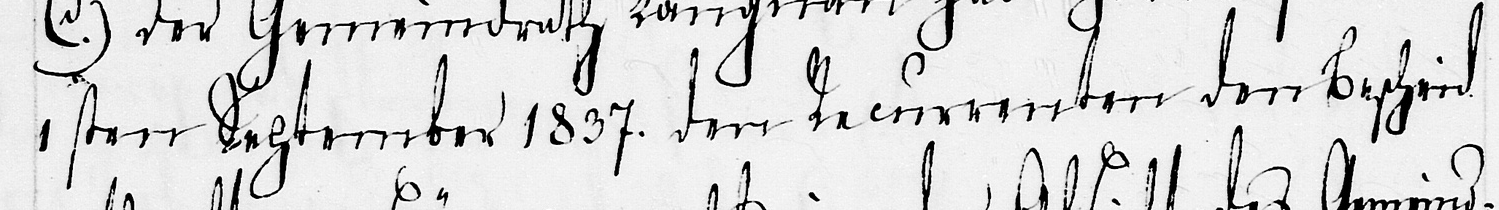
1sten September 1837. den Recurrenten den Bescheid
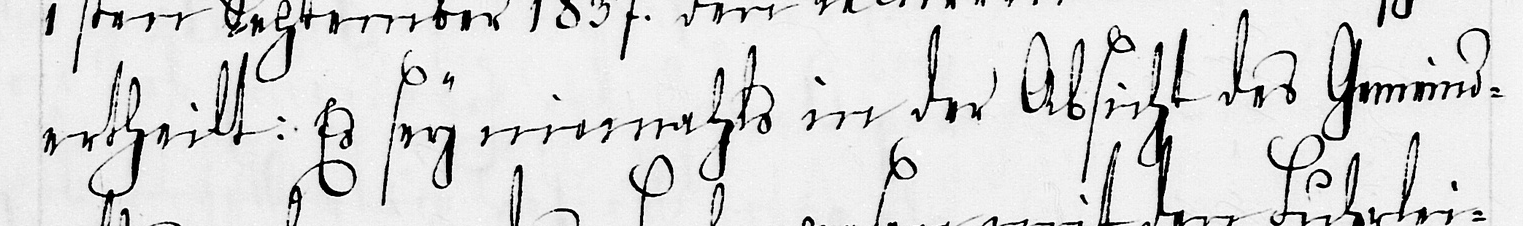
ertheilt: Es sey niemahls in der Absicht des Gemeind¬
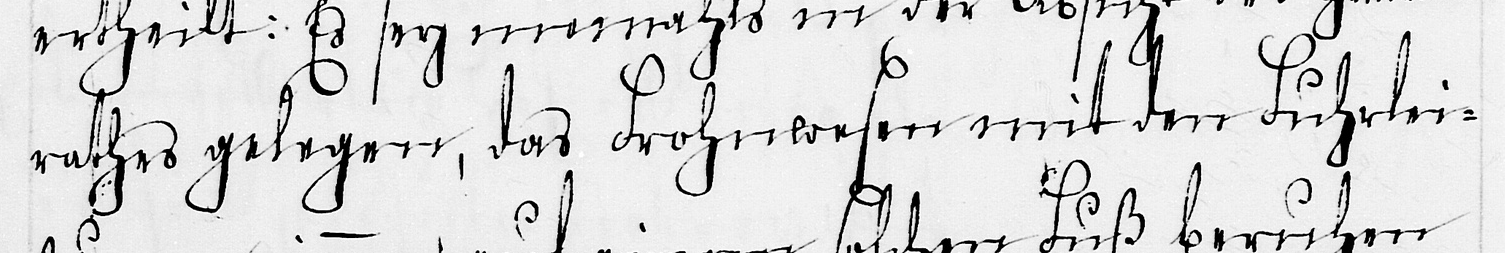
rathes gelegen, das Frohnwesen mit den Fuhrlei¬
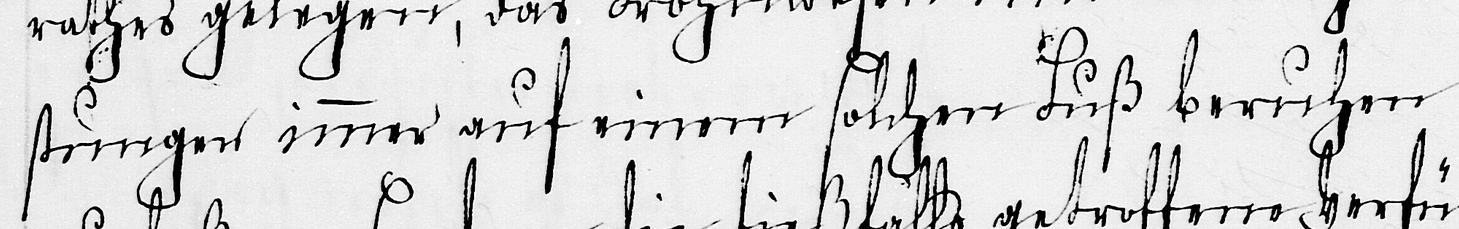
stungen immer auf einem solchen Fuß beruhen
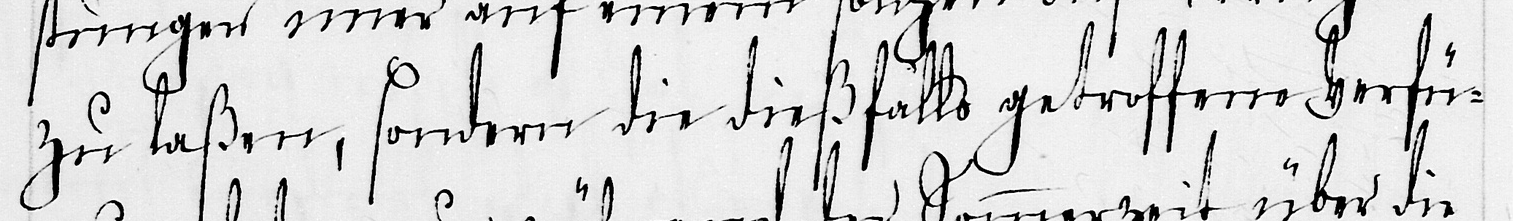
zu laßen, sondern die dießfalls getroffene Verfü¬
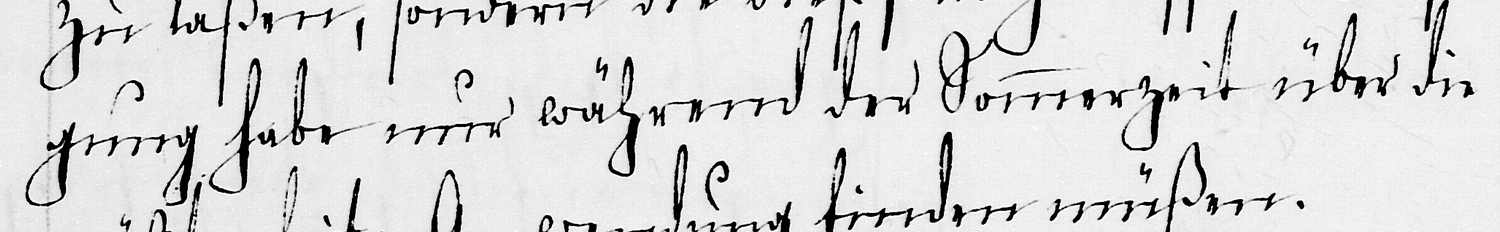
gung habe nur während der Sommerzeit über die
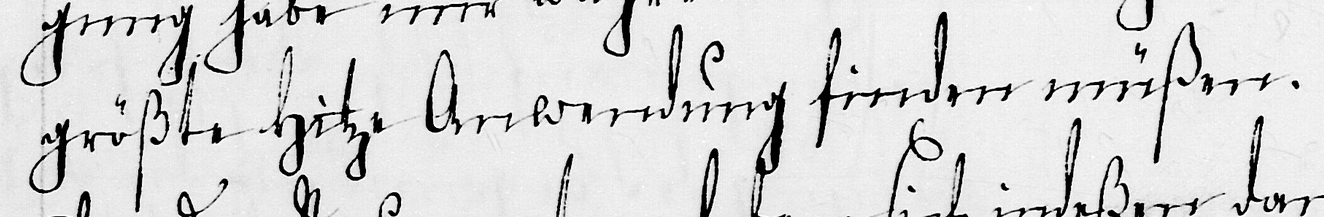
größte Hitze Anwendung finden müßen.
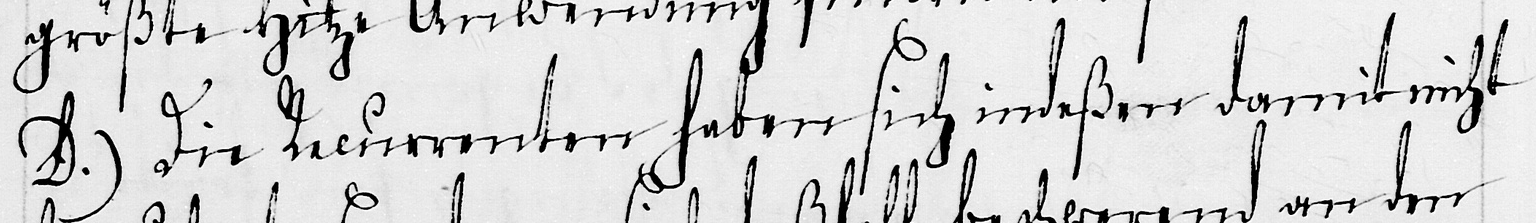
D.) Die Recurrenten haben sich indeßen damit nicht
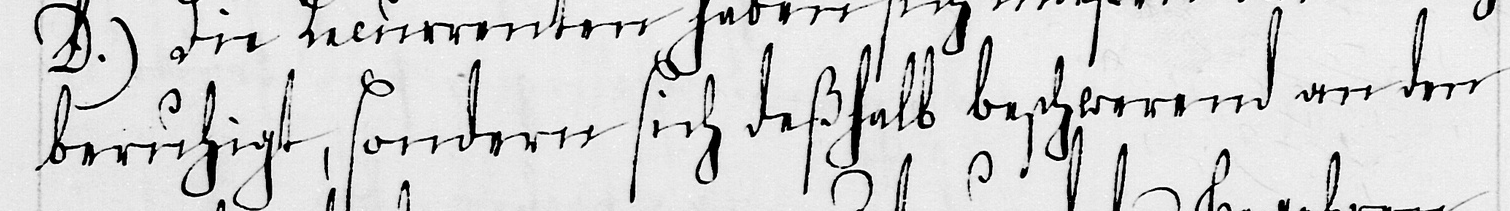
beruhigt, sondern sich deßhalb beschwerend an den
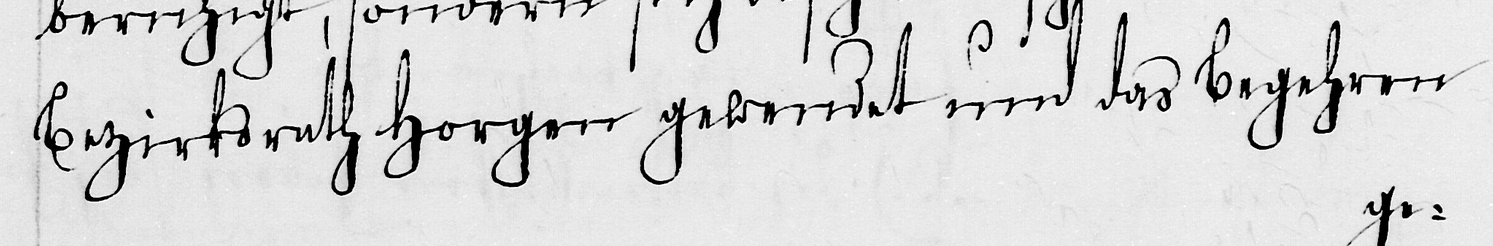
Bezirksrath Horgen gewendet und das Begehren
